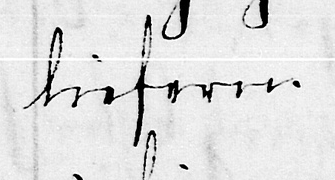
liefern.
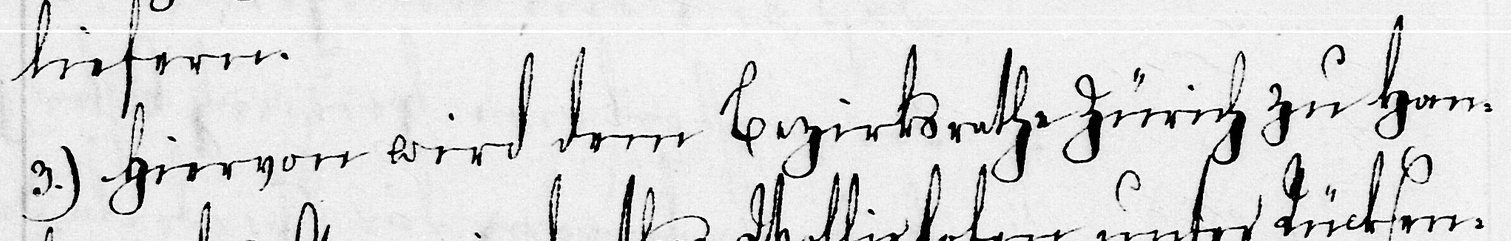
3.) Hiervon wird dem Bezirksrathe Zürich zu Han¬
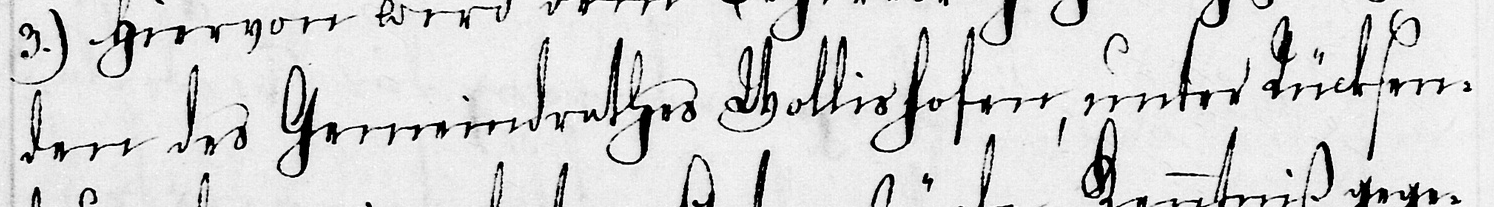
den des Gemeindrathes Wollishofen, unter Rücksen¬
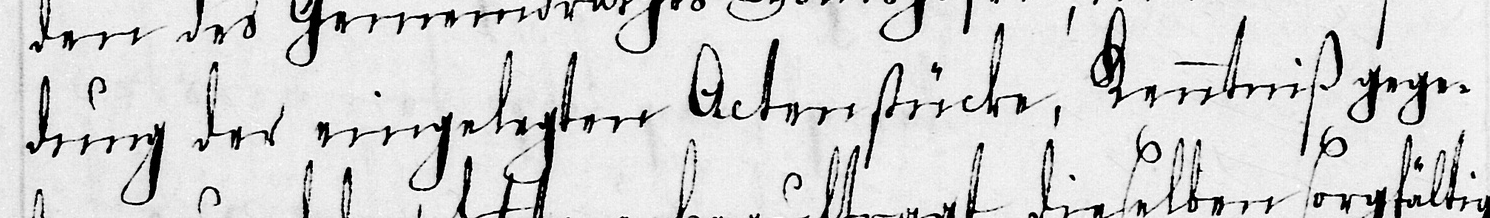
dung der eingelegten Actenstücke, Kenntniß gege¬
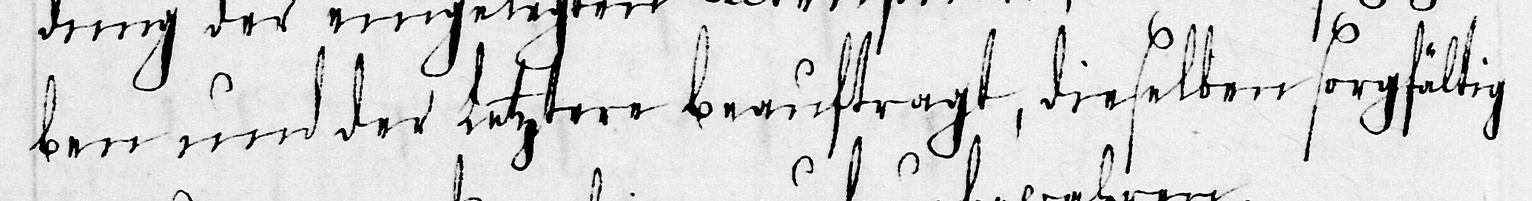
ben und der Letztere beauftragt, dieselben sorgfältig
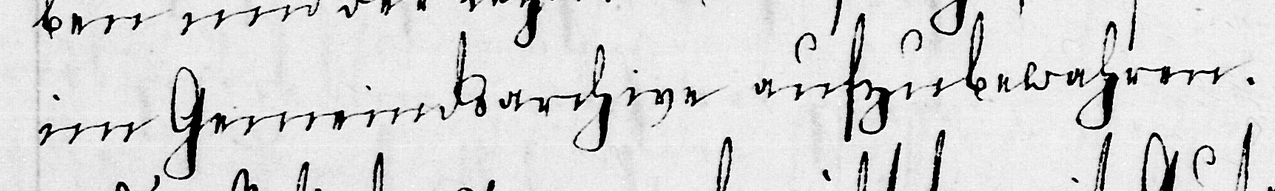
im Gemeindsarchive aufzubewahren.
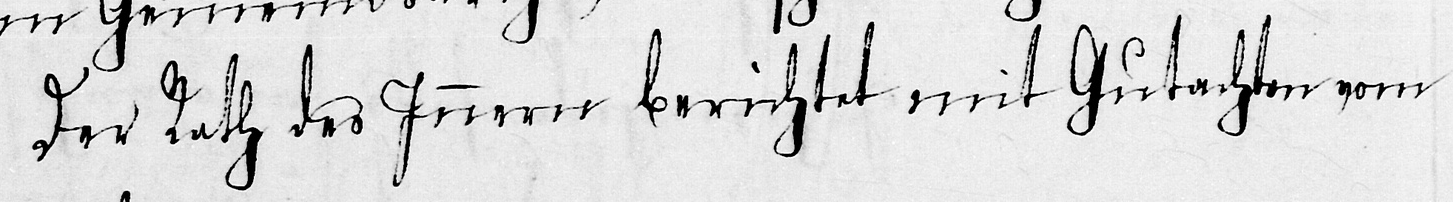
Der Rath des Innern berichtet mit Gutachten vom
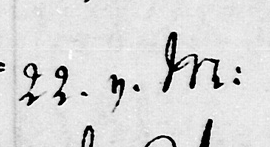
22. v. M.:
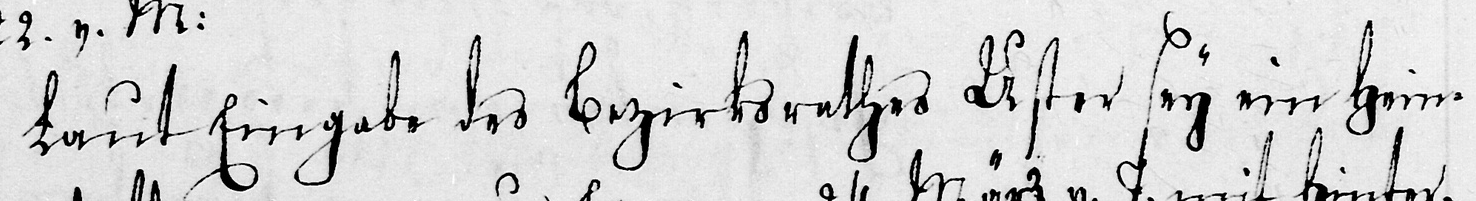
Laut Eingabe des Bezirksrathes Uster sey ein Hein¬
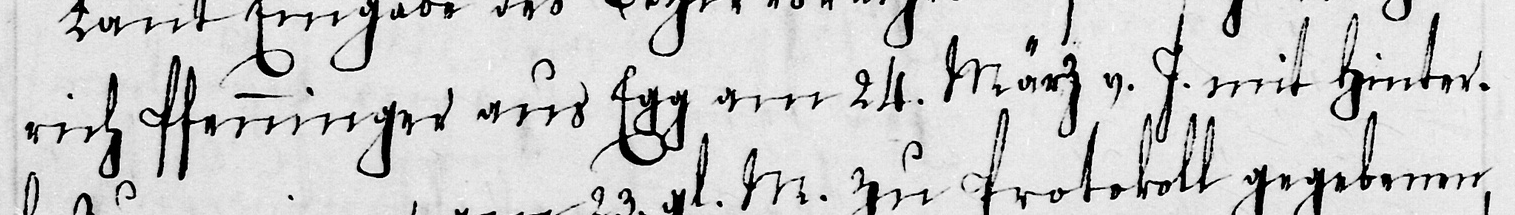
rich Pfenninger aus Egg am 24. März v. J. mit Hinter¬
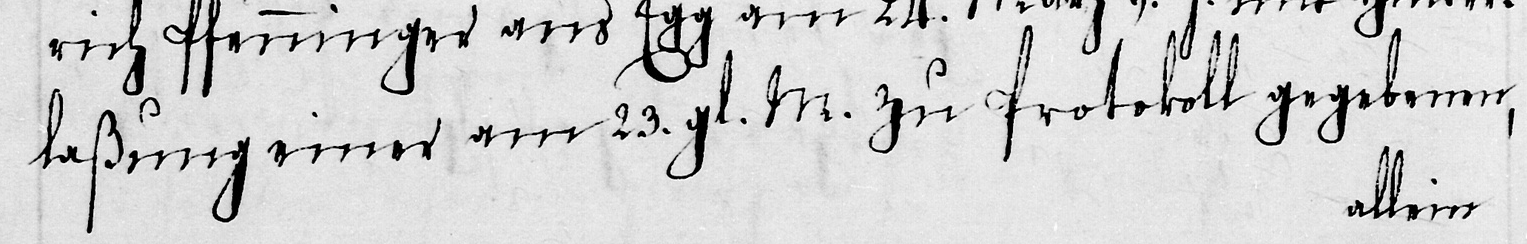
laßung einer am 23. gl. M. zu Protokoll gegebenen,
